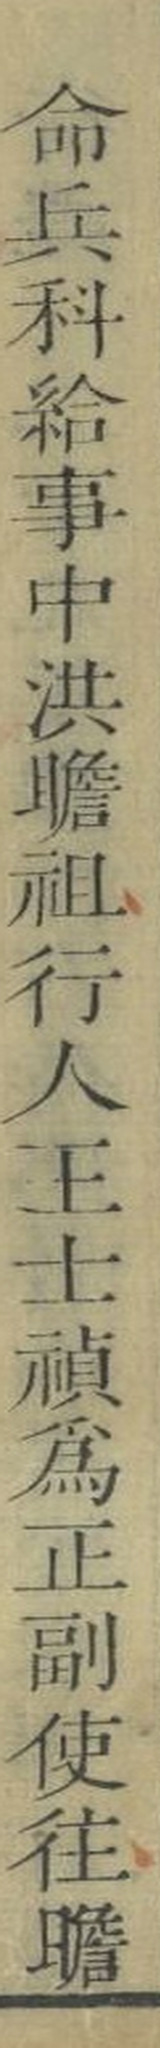命兵科給事中洪瞻祖行人王士禎為正副使往瞻
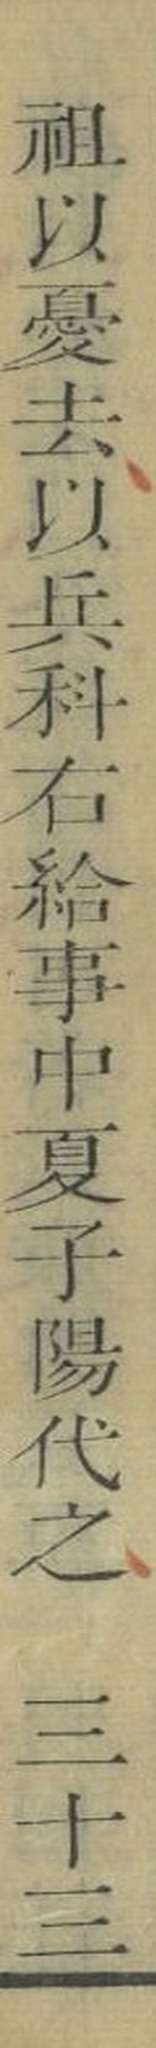祖以憂去以兵科右給事中夏子陽代之三十三
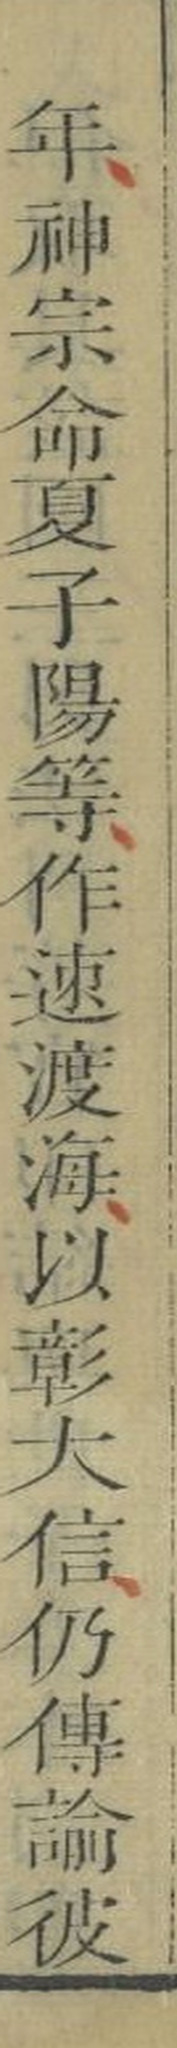年神宗命夏子陽等作速渡海以彰大信仍伝諭彼
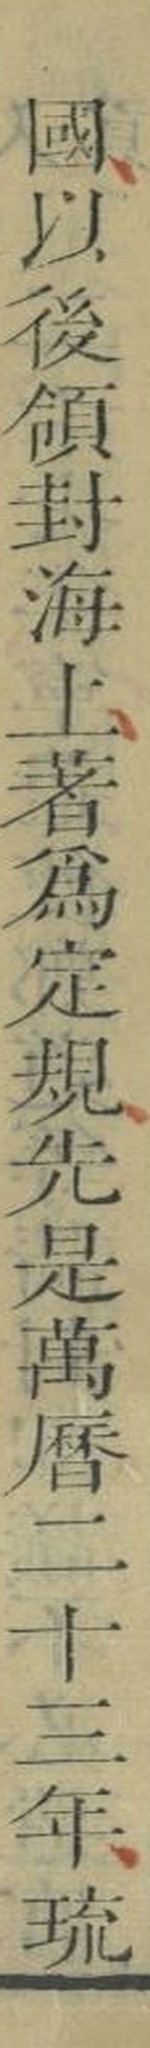国以後領封海上著為定規先是万暦二十三年琉
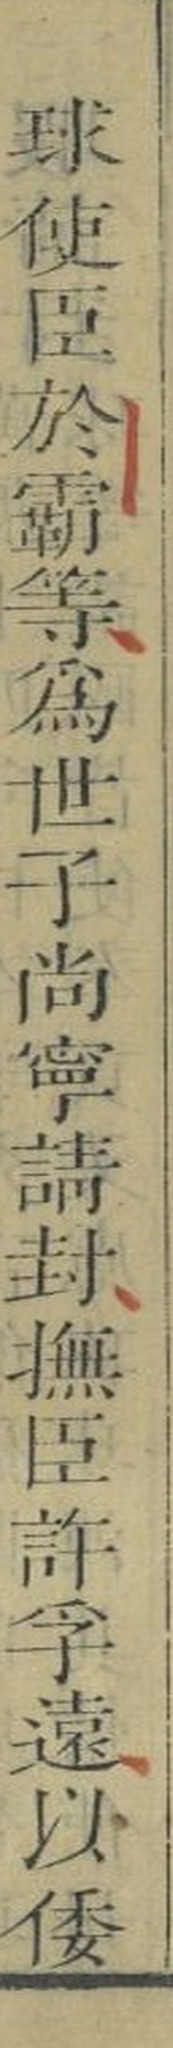球使臣於覇等為世子尚寧請封撫臣許孚遠以倭
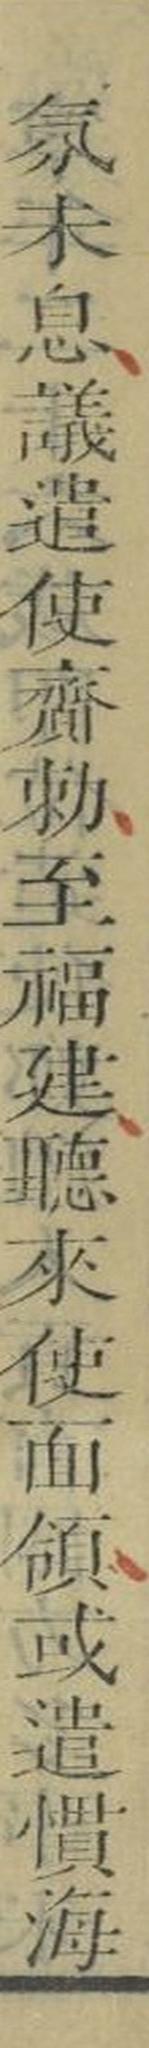氛未息議遣使齎勅至福建聴来使面領或遣慣海
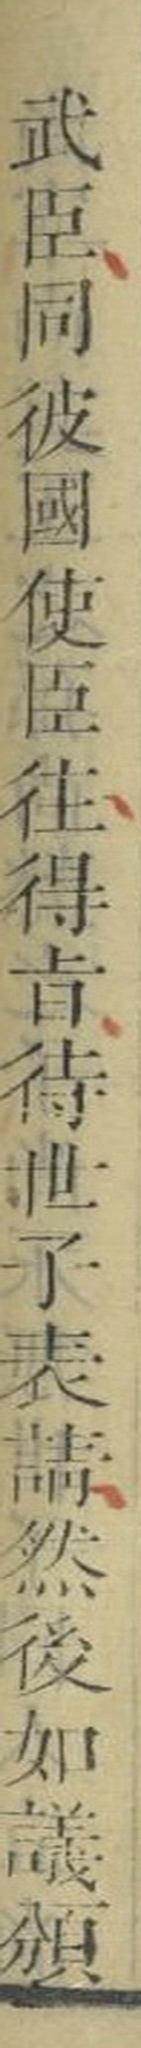武臣同彼国使臣往得旨待世子表請然後如議頒
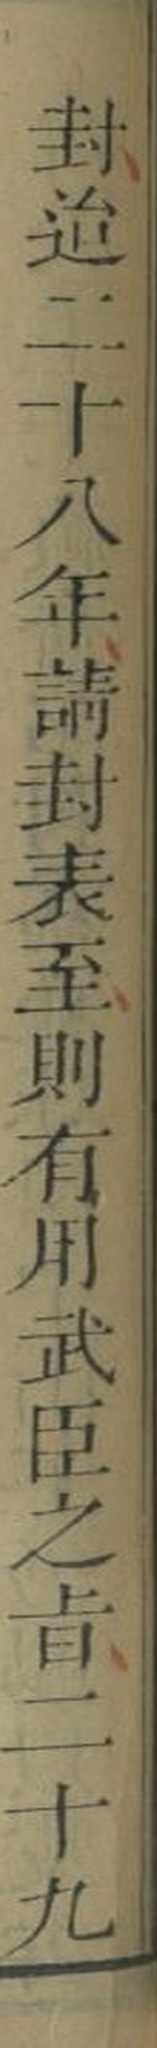封迨二十八年請封表至則有用武臣之旨二十九
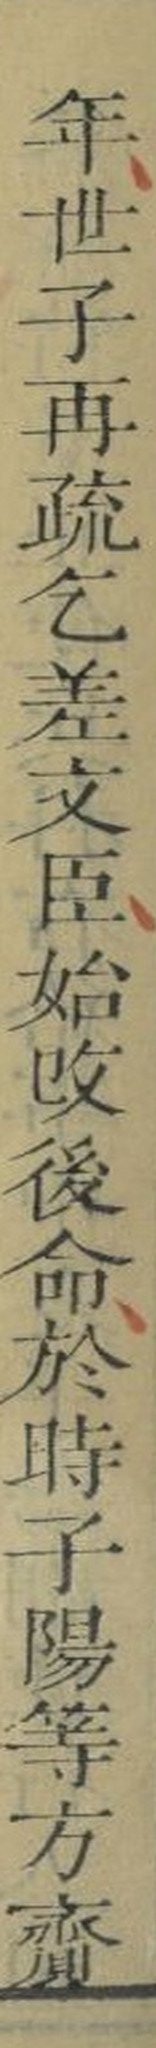年世子再疏乞差文臣始改後命於時子陽等方齎
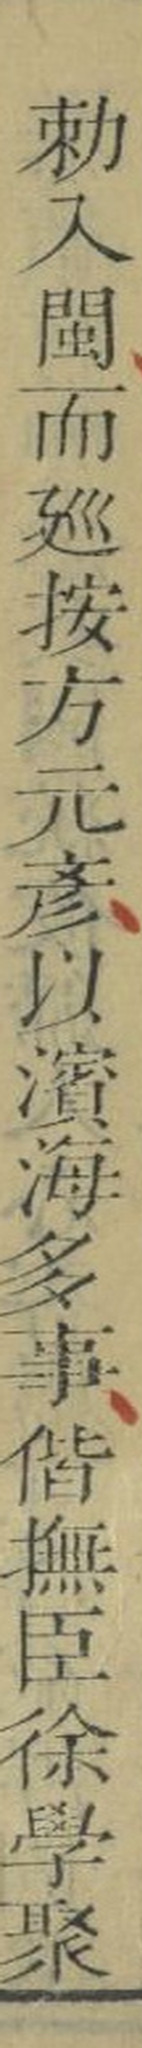勅入閩而巡按方元彦以浜海多事偕撫臣徐学聚
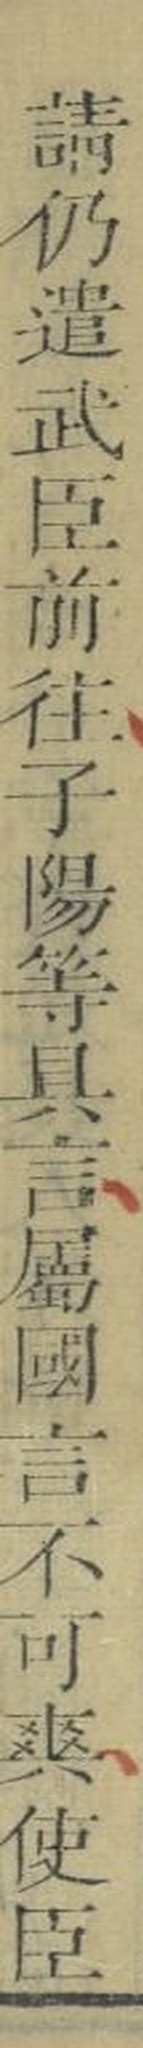請仍遣武臣前往子陽等具言属国言不可爽使臣
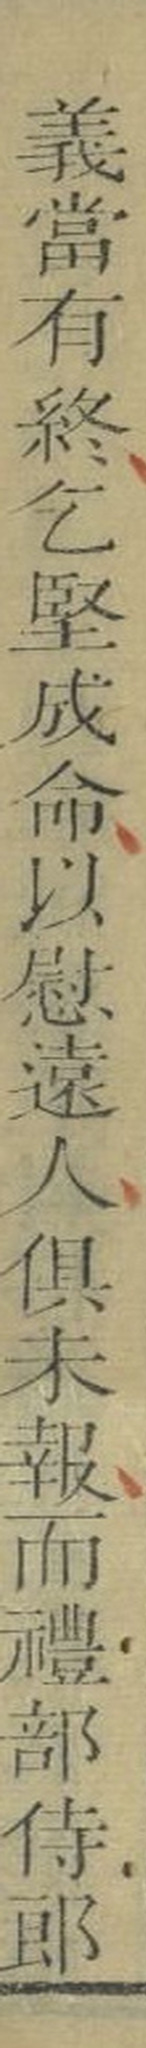義当有終乞堅成命以慰遠人俱未報而礼部侍郎
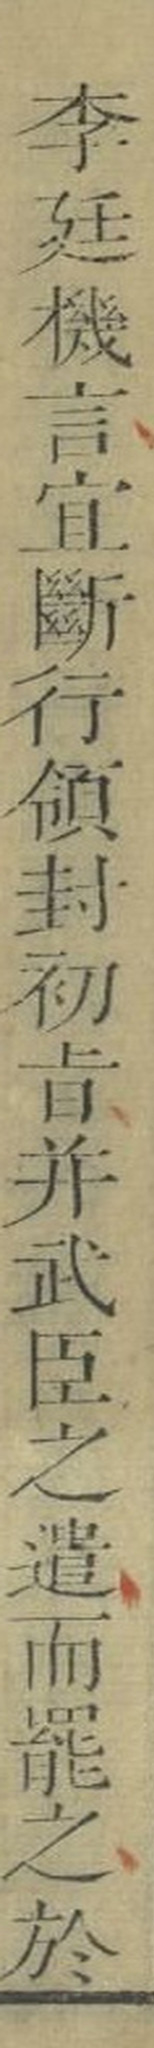李廷機言宜断行領封初旨并武臣之遣而罷之於
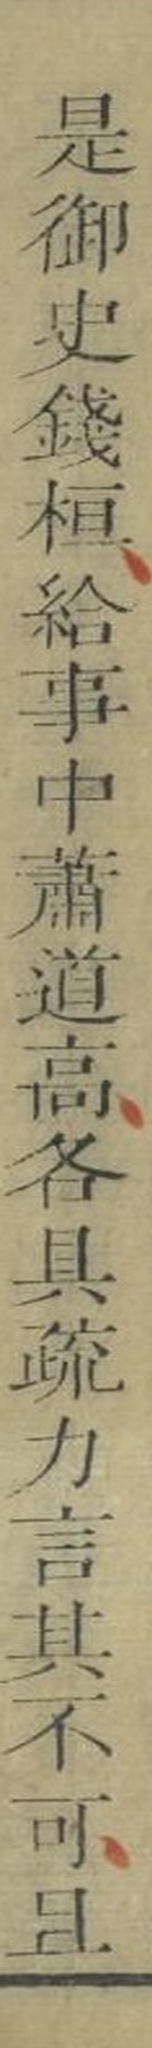是御史銭桓給事中蕭道高各具疏力言其不可且
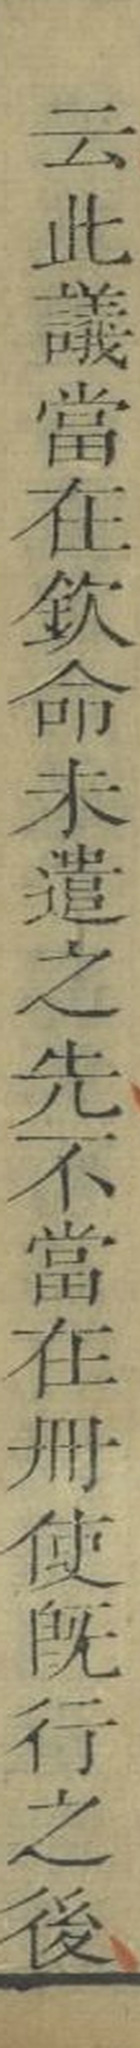云此議当在欽命未遣之先不当在冊使既行之後
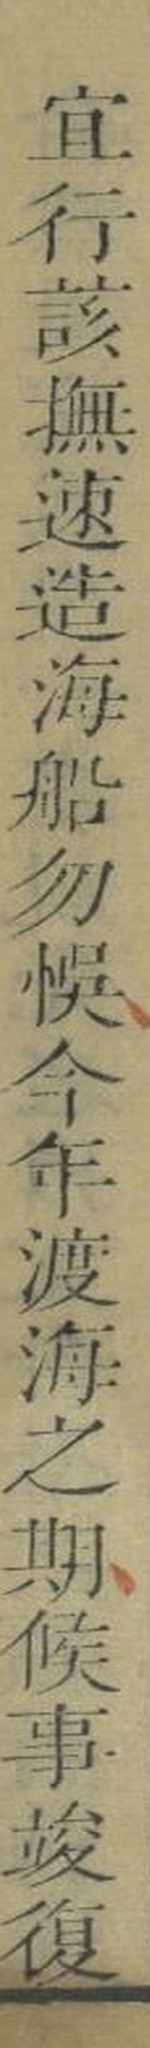宜行該撫速造海船勿悞今年渡海之期候事竣復
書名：中山伝信録 巻三
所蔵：University of the Ryukyus Library
